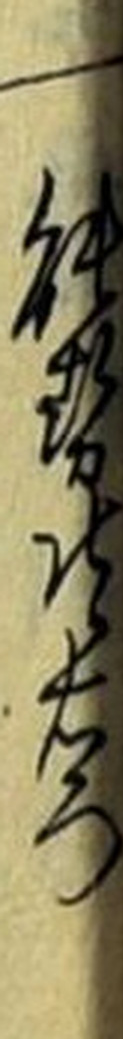吉田次郎右衛門
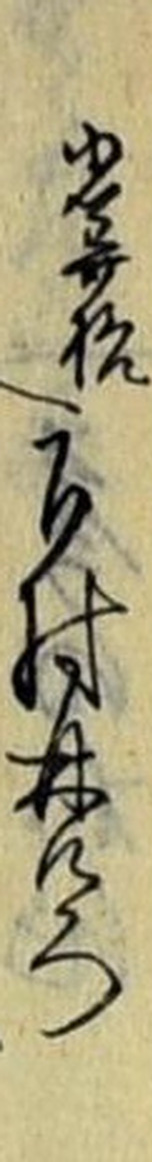小算格下村林右衛門
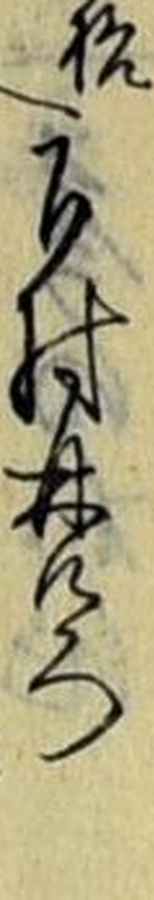玉村理左衛門
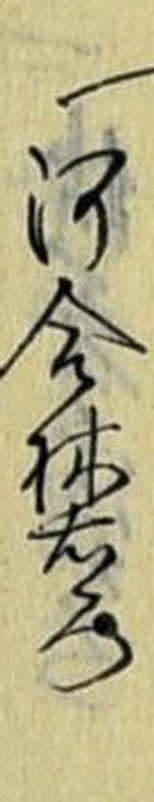々河合林右衛門
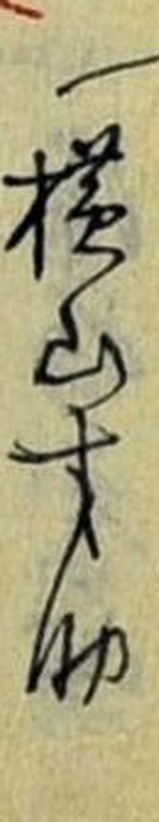横山才助
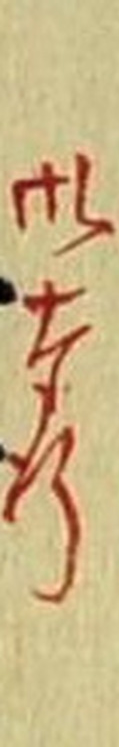御奉行
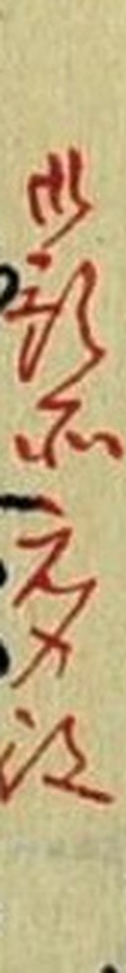御預所取〆役
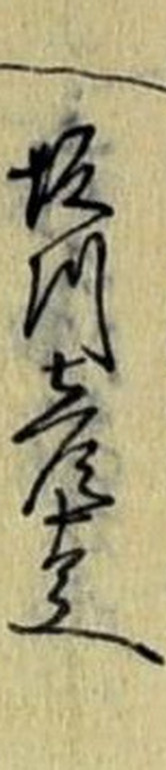坂川彦太夫
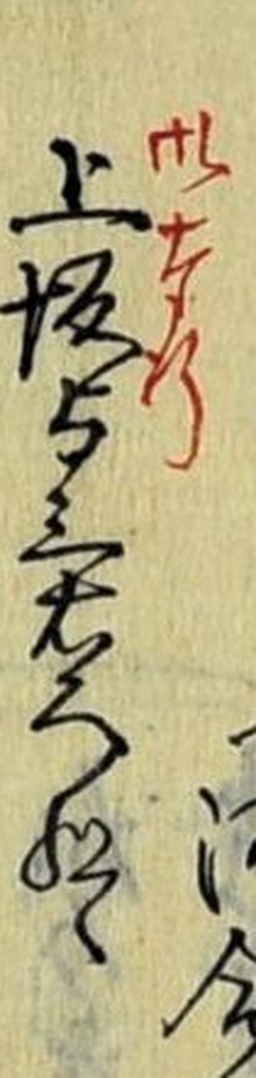上坂与三右衛門組へ
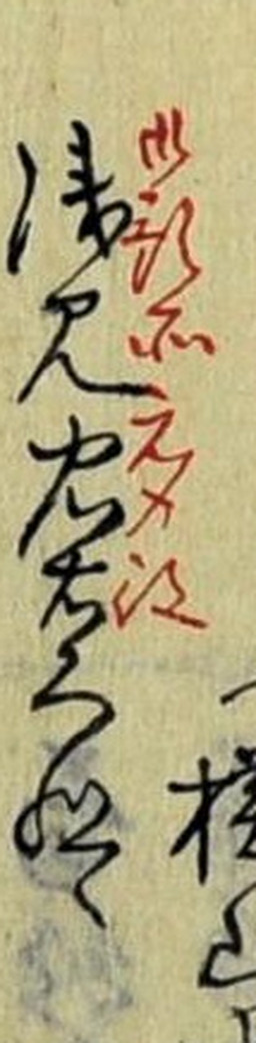浅見忠右衛門組へ
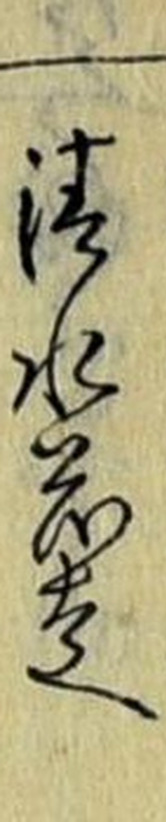清水茂太夫
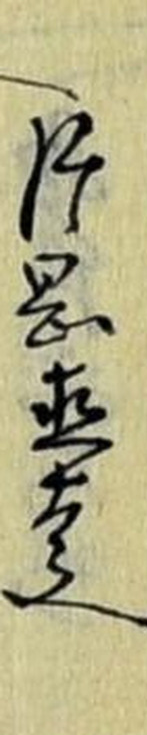片岡忠太夫
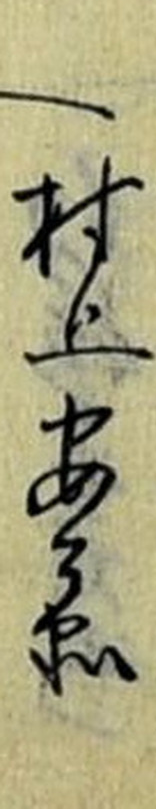村上安兵衛
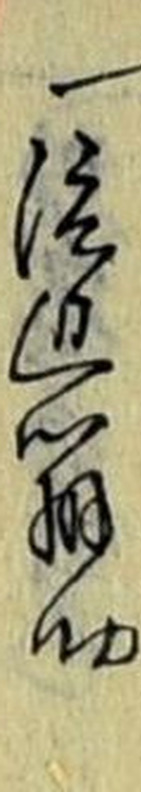渡辺弁助
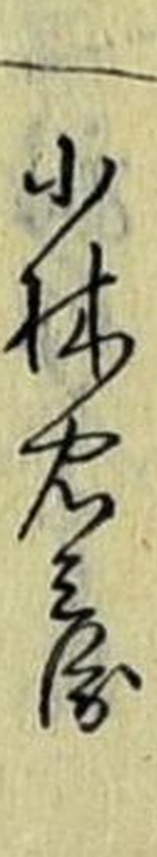小林忠兵衛
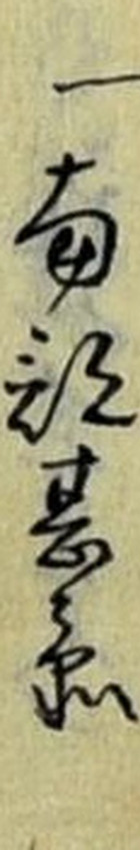南部甚兵衛
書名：命令之部 四
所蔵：福井県文書館 Fukui Prefectural Archives
